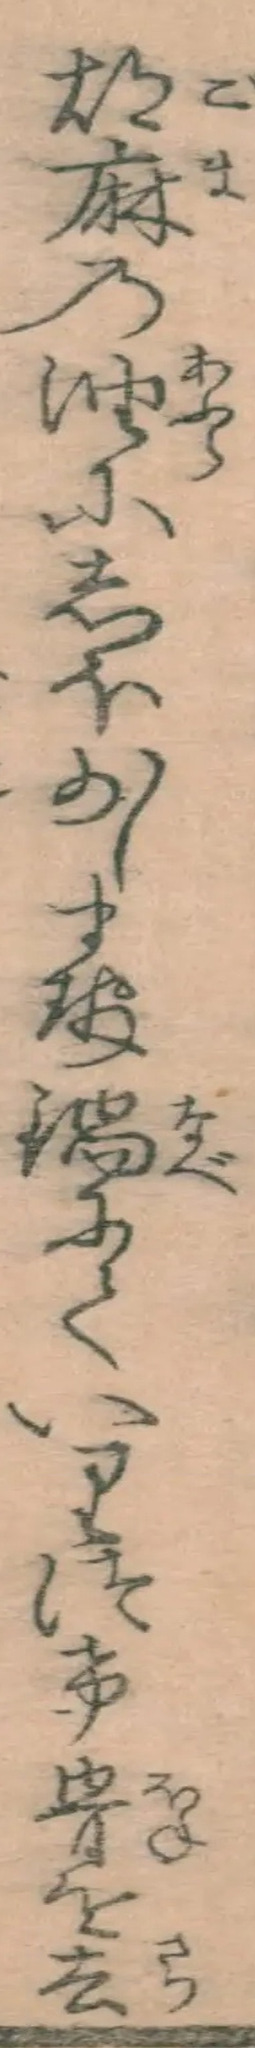胡麻の油にしほ少しませ鍋にていりつけ骨を去
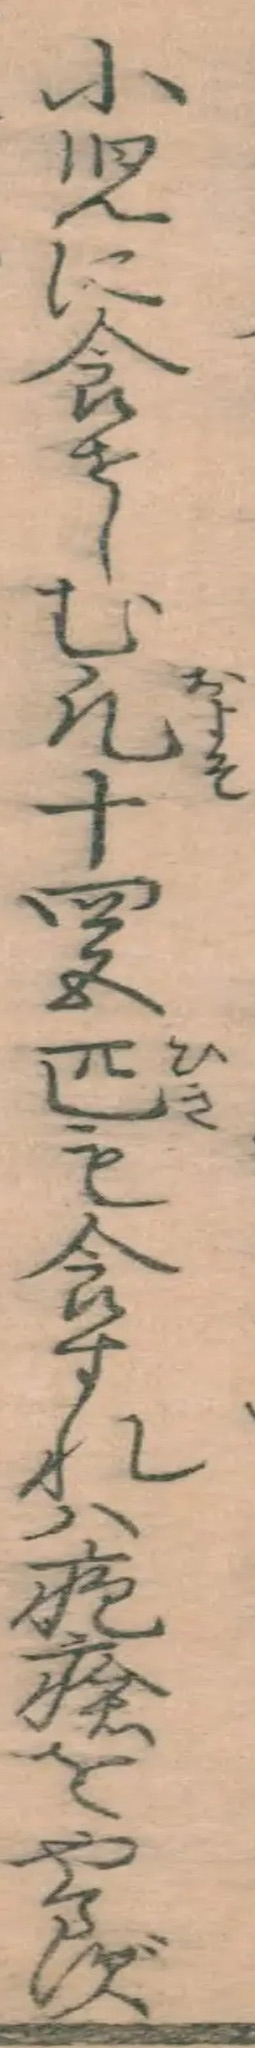小児に食せしむ凡十四五匹も食すれは疱瘡をやまず
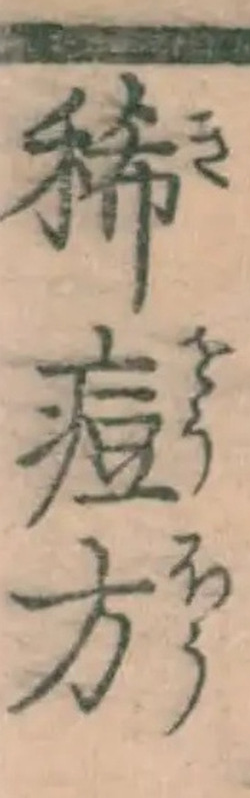稀痘方
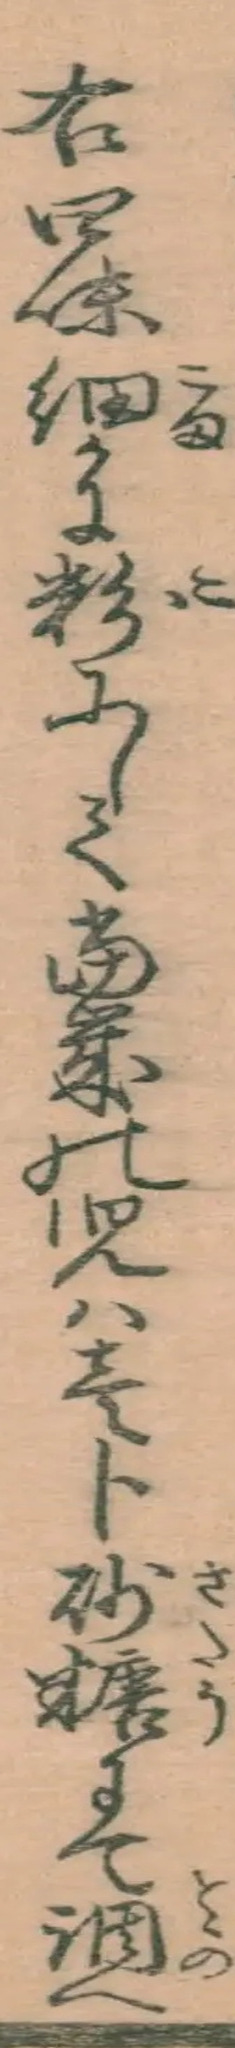右四味細かに粉にして当歳の児は壱分砂糖にて調へ
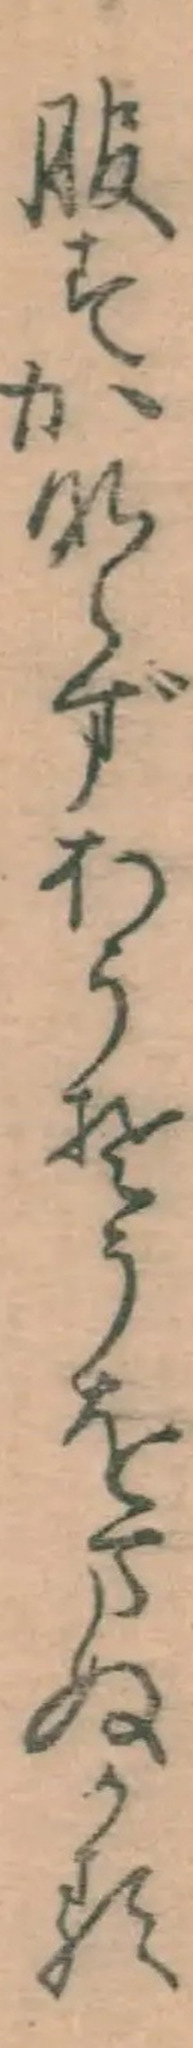服すかならずほうそうをまぬかる

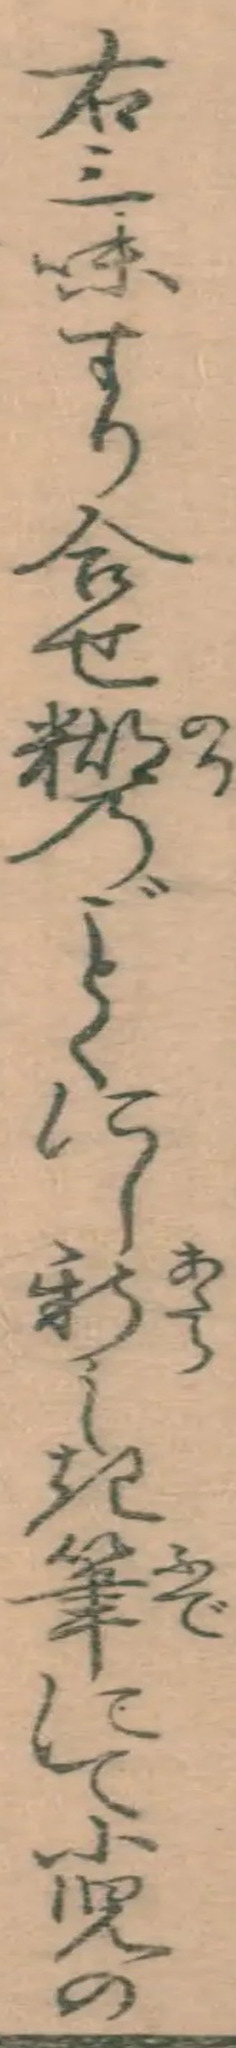右三味すり合せ糊のごとくにし新しき筆にて小児の
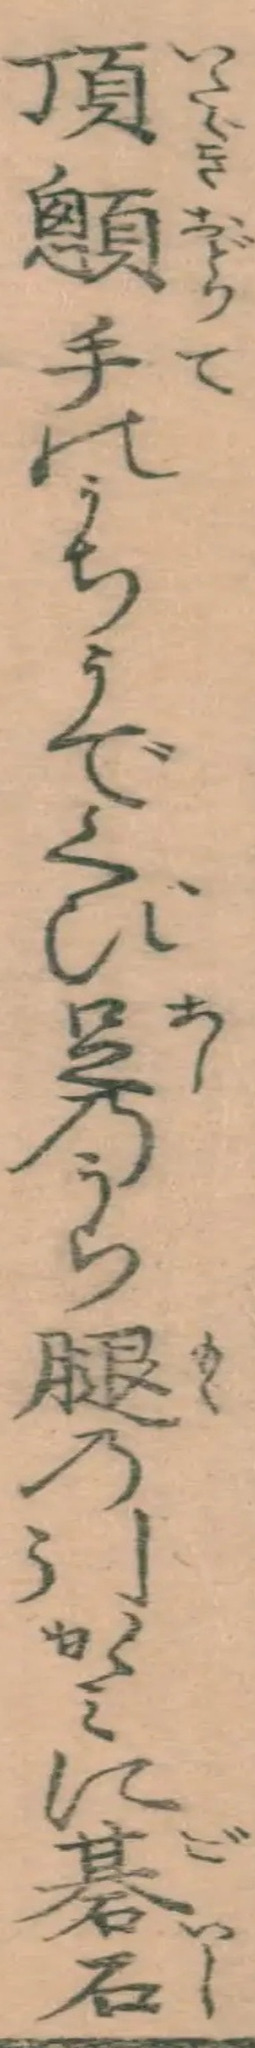頂顖手のうちうでくび足のうら腿の引かゝみに碁石
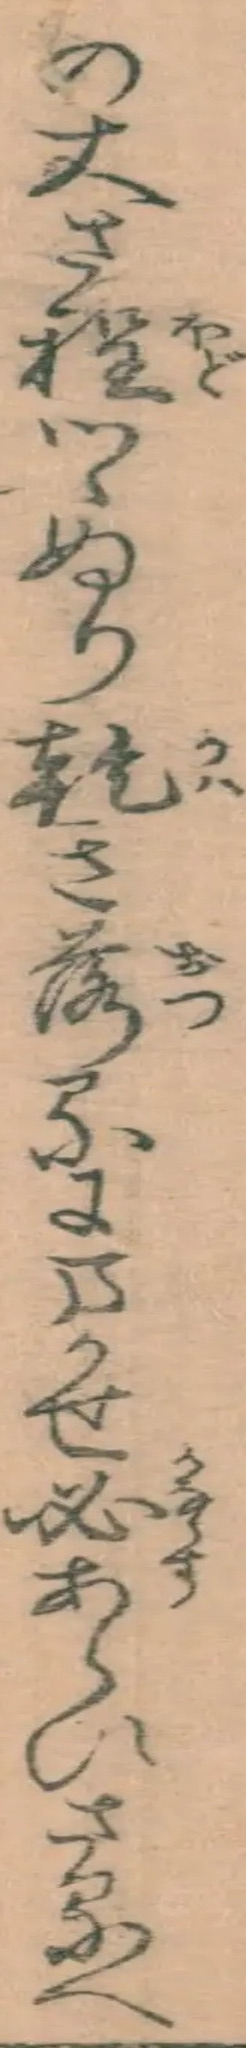の大さ程つゝぬり乾き落るにまかせ必あらひさるへ
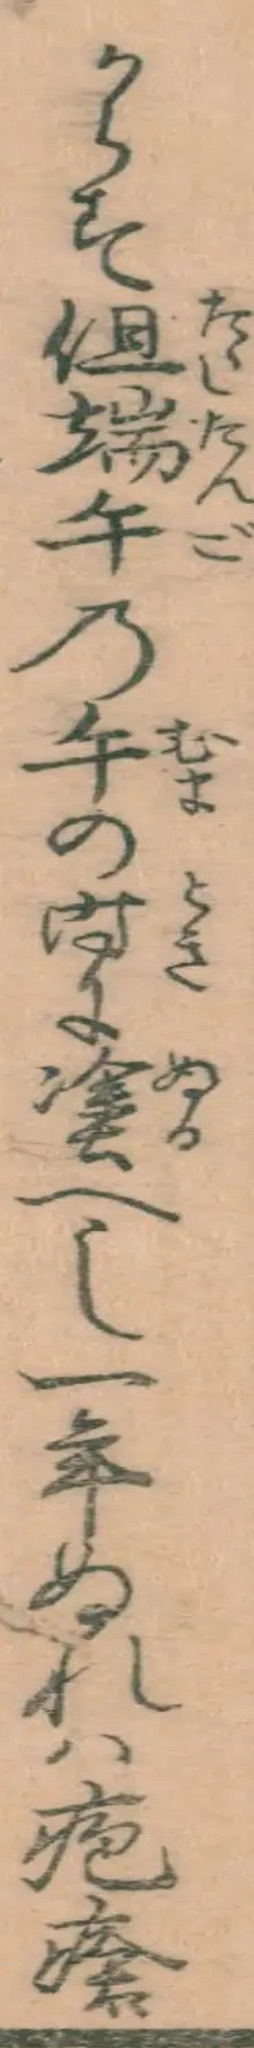からす但端午の午の時に塗へし一年ぬれは疱瘡
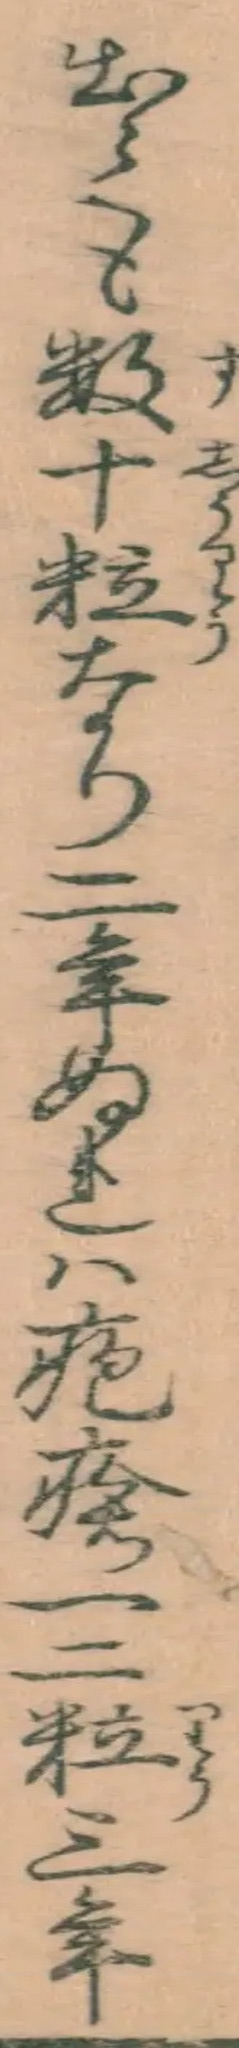出ても数十粒なり二年ぬれは疱瘡一二粒三年
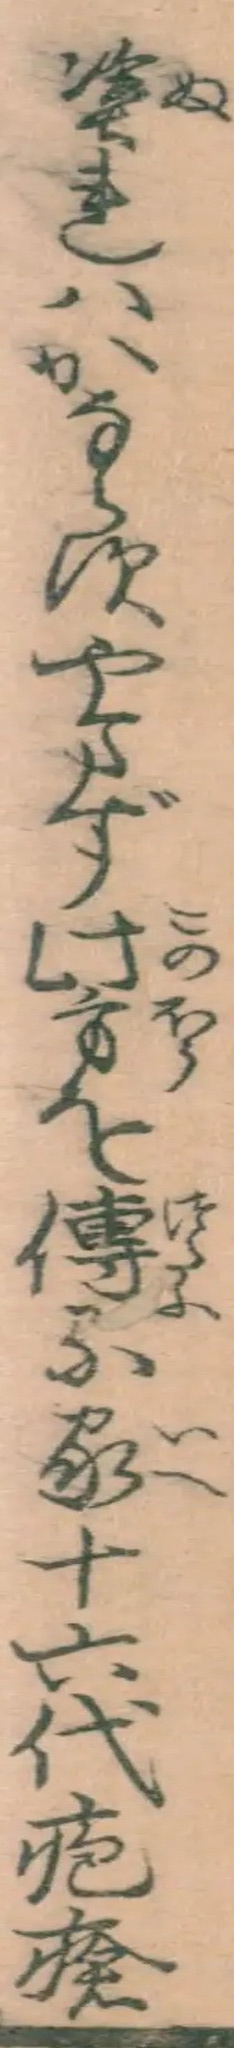塗れはかならすやまず此方を伝る家十六代疱瘡
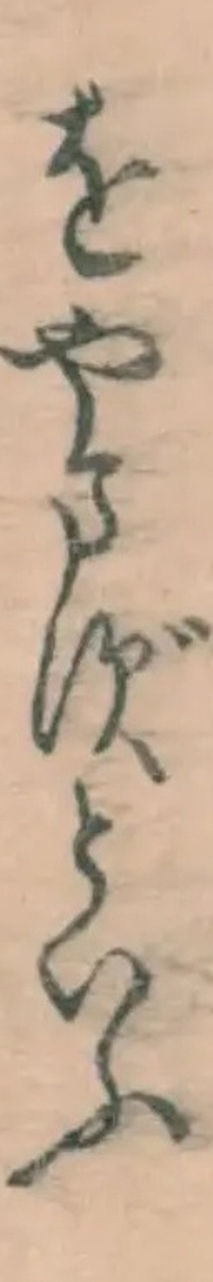をやまずといふ
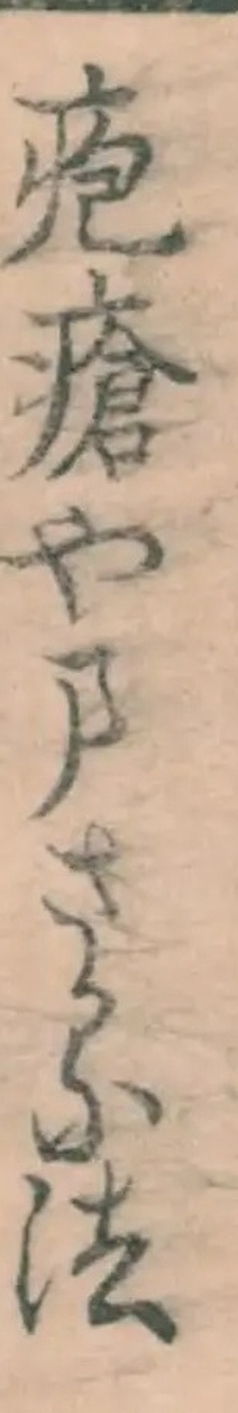疱瘡やまさる法
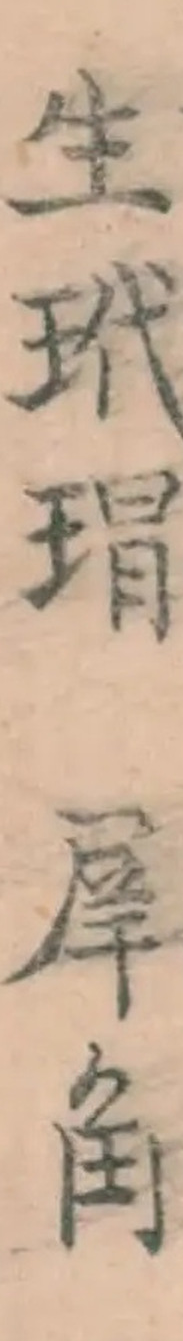生玳瑁犀角
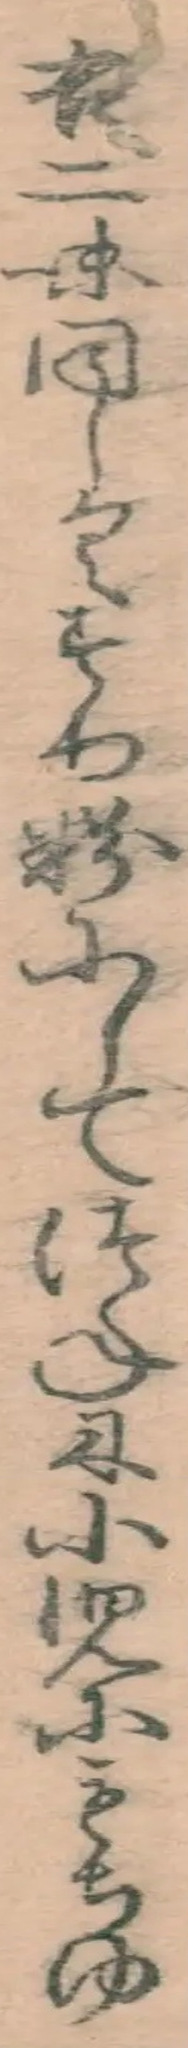右二味同しくすり粉にしてつねに小児にもちゆ
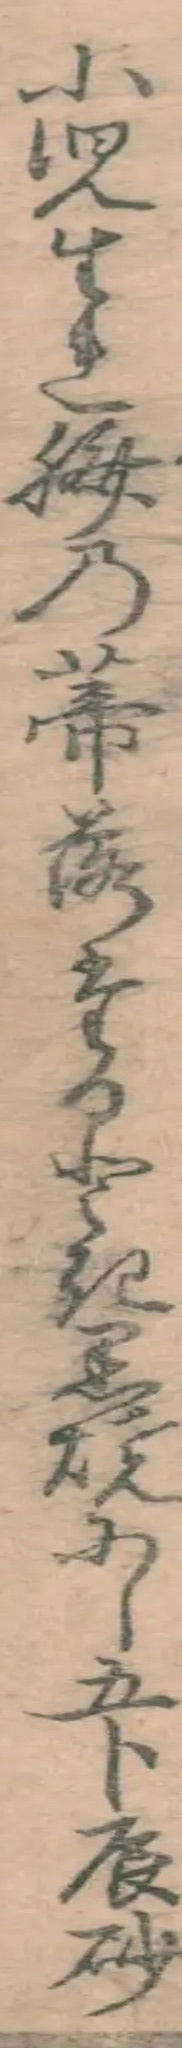小児生れ臍の蔕落たるとき黒焼にし五分辰砂
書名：雨夜談
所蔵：国立国会図書館 National Diet Library, JAPAN
